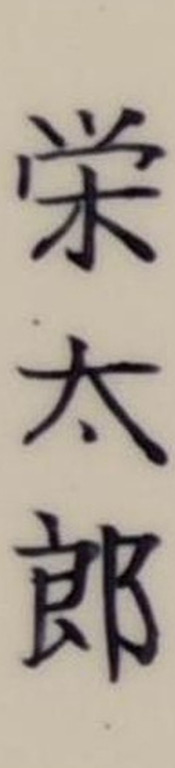栄太郎

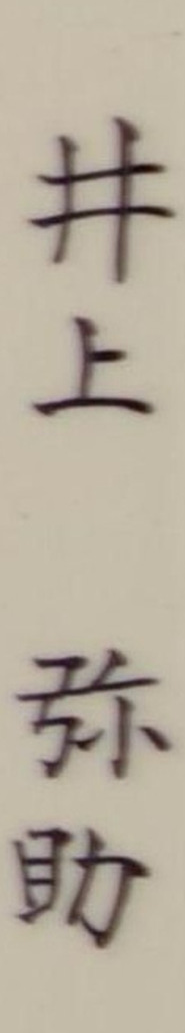井上弥助
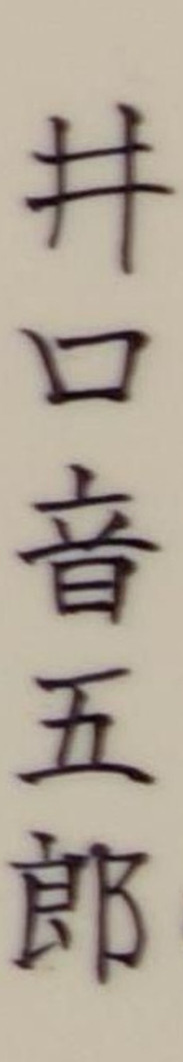井口音五郎
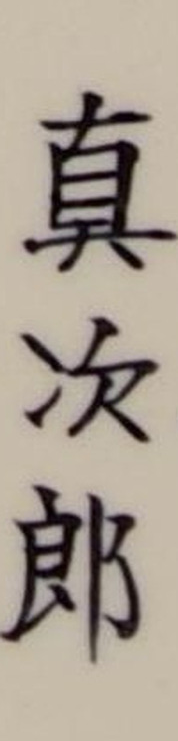真次郎
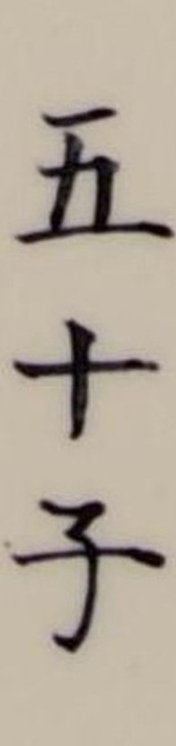五十子
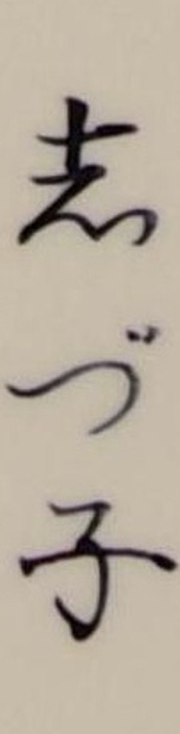しづ子
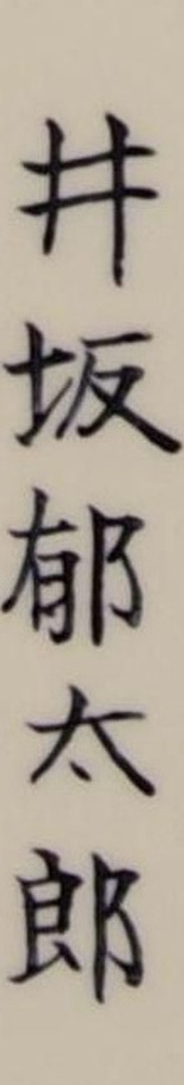井坂郁太郎
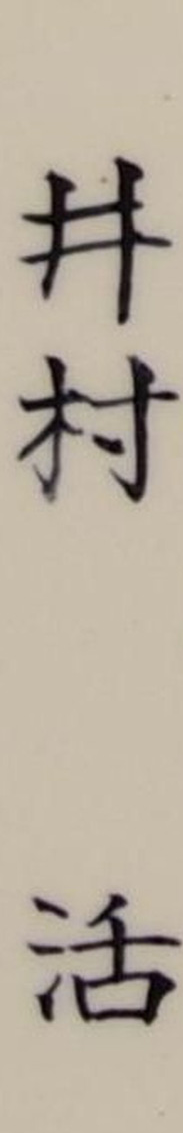井村活
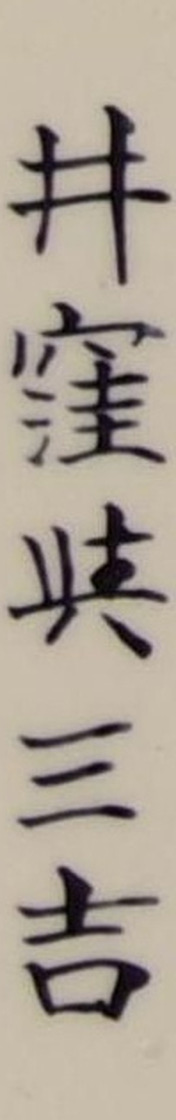井窪与三吉
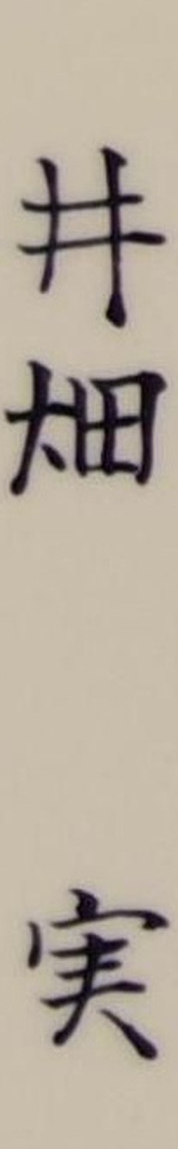井畑実
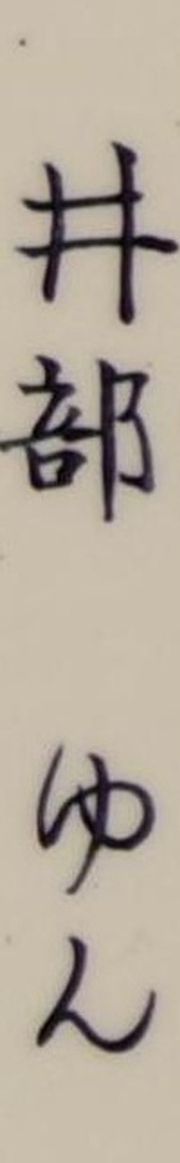井部ゆん
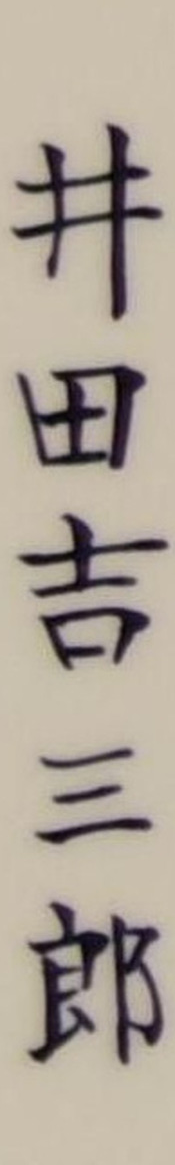井田吉三郎
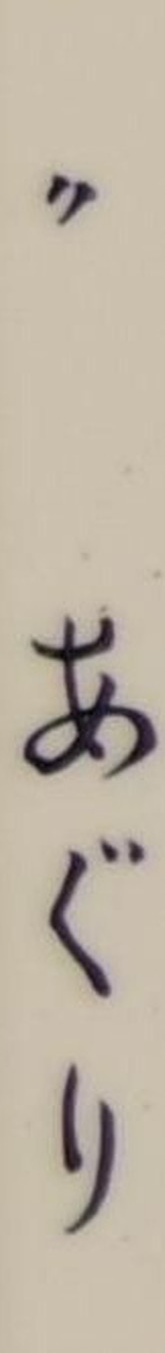あぐり
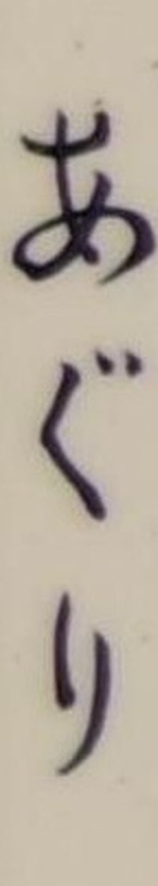あぐり

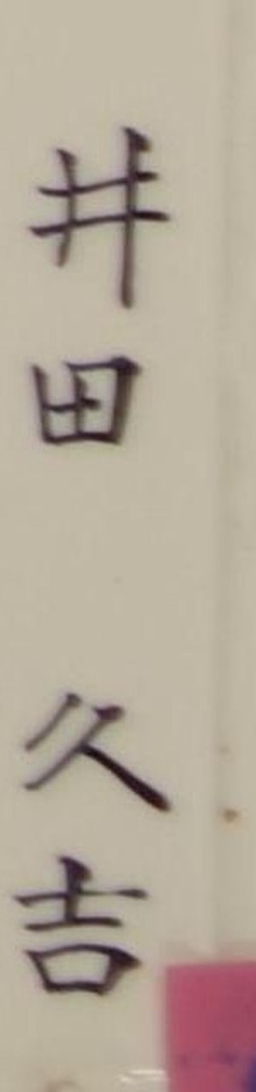井田久吉
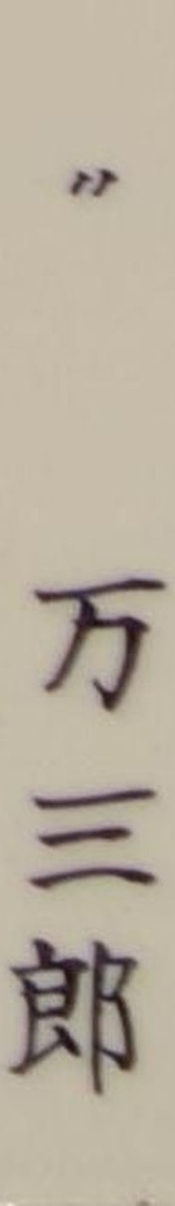万三郎
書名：M~S
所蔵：高野山金剛峯寺
